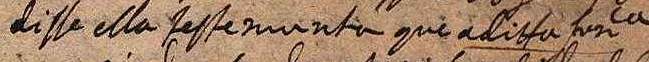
disse ella testemunha que a ditta frnca
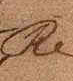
Re
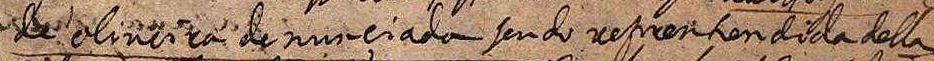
de oliueira denunciada sendo reprenhendida della
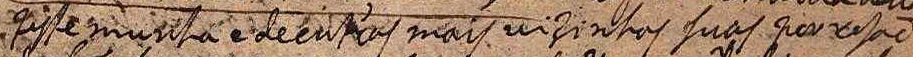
testemunha e de outras mais uizinhas suas por resaõ
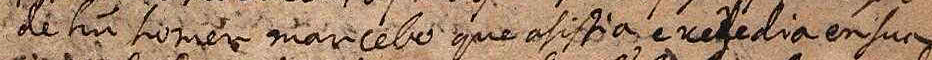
de hū homem mancebo que asistia, e rezedia em sua
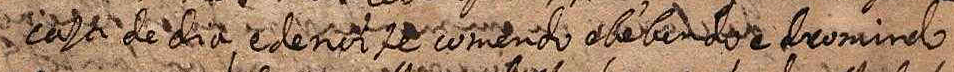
caza de dia, e de noite comendo e bebendo, e dromindo
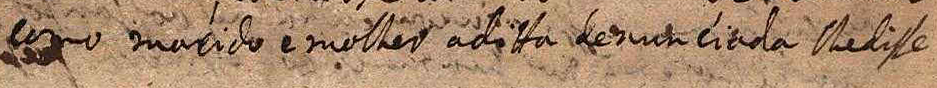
como marido e molher a ditta denunciada lhe disse
